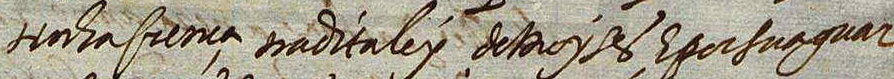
tinha Crença na dita ley de moyses, E per sua guar
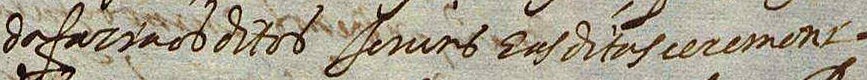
da fazia aos ditos Jeiuns E as ditas ceremoni
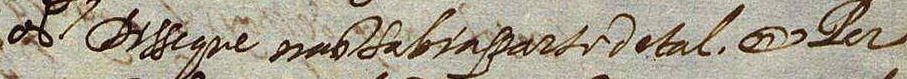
as Disse que naõ sabia parte de tal. ⁋ Per
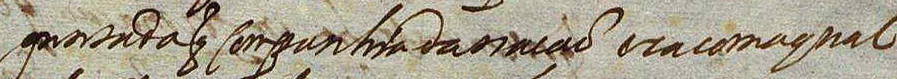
guntada q̄ Companhia da naçaõ era com a qual
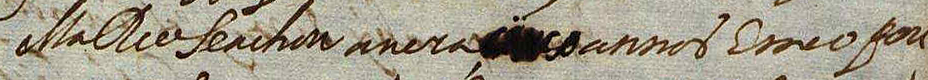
ella Ree se achou auera ___co annos E meo pou
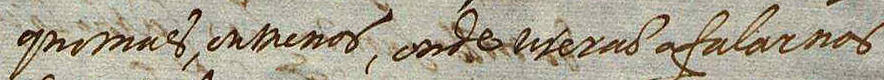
quo mais, ou menos, onde uieraõ a falar nas
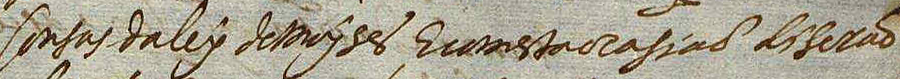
Cousas da ley de moyses, E com esta ocasiaõ diseraõ
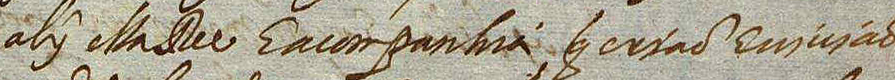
aly ella Ree E a companhia q̄ criaõ e uiuiaõ
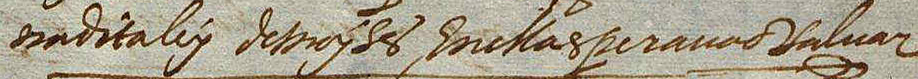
na dita ley de moyses, E nella esperauaõ saluar
